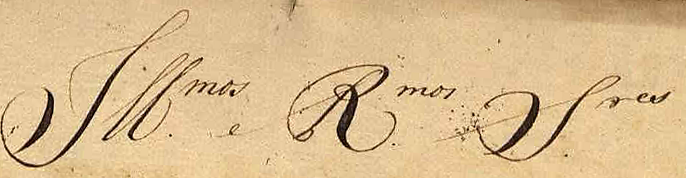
Jll.mos e R.mos S.res
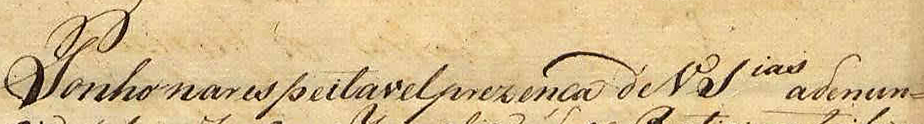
Ponho na respeitavel prezença de V S.ias a denun
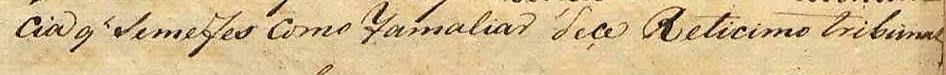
cia q̄ semefes como famaliar dece Reticimo tribunal
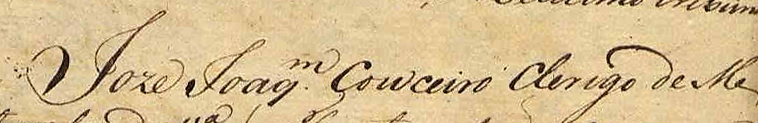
Ioze Ioaq.m Couceiro clerigo de Me
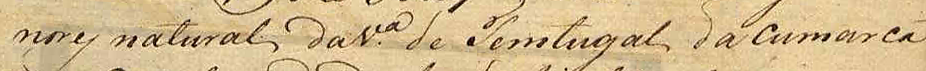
nores natural da v.a de Temtugal da cumarca
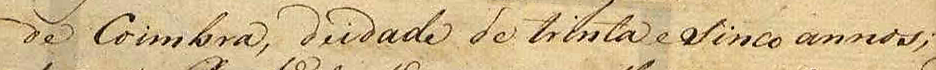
de Coimbra, de idade de trinta e sinco annos;
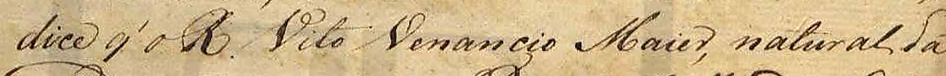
dice q̄ o R. Vito Venancio Maier, natural da
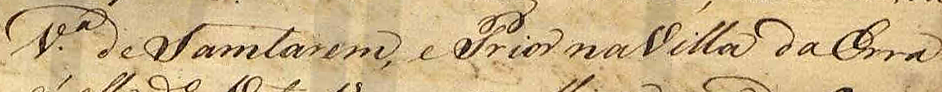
V.a de Samtarem, e Prior na Villa da Erra
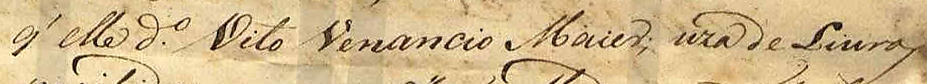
q̄ elle d.o Vito Venancio Maier; uza de Liuros
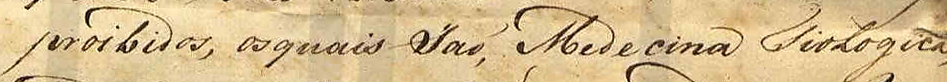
proibidos, os quais Saõ, Medecina TioLogica,
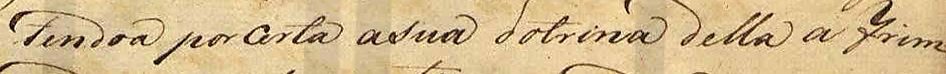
tendoa por certa a sua dotrina della afrim
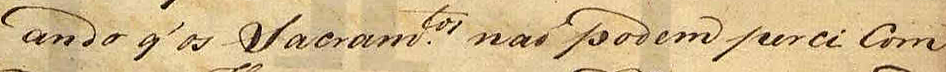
ando q̄ os Sacram.tos naõ podem per ci com
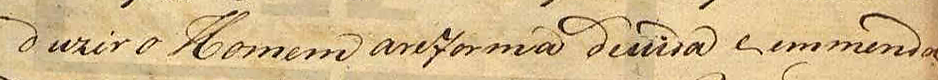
duzir o Homem a reforma deuida e emmenda
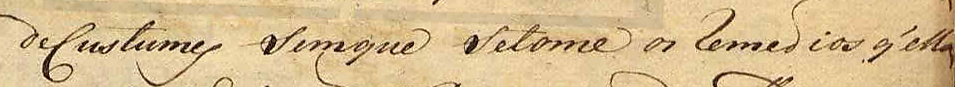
de Custumes sem que se tome os Remedios q̄ ella
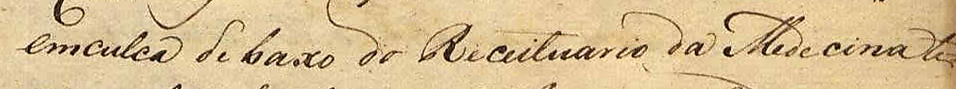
emculca, debaxo do Receituario da Medecina te
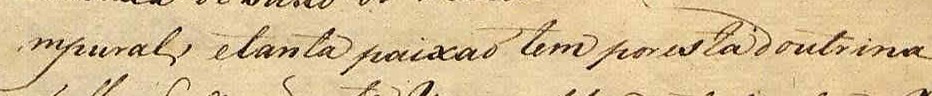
mpural, e tanta paixaõ tem por esta doutrina
